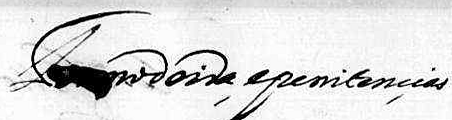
T_mo de ida, e penitencias
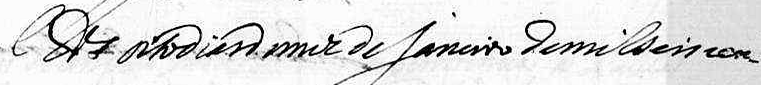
Aos oito dias do mez de Janeiro de mil seiscen
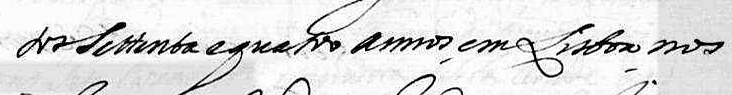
tos Settenta e quatro annos em Lisboa nos
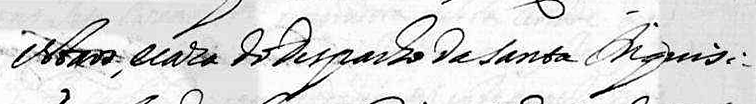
estaos, e caza do Despacho da Santa Inquisi
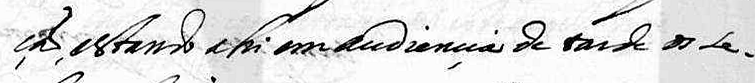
çaõ, estando ahi em audiencia de tarde os se
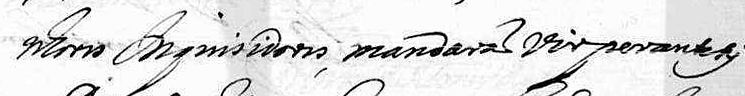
nhores Inquisidores, mandaraõ vir perante sy
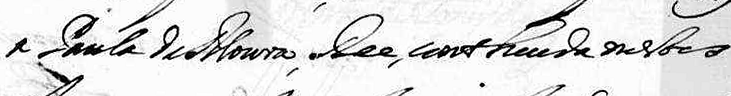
a Paula de Moura, Ree, contheuda nestes
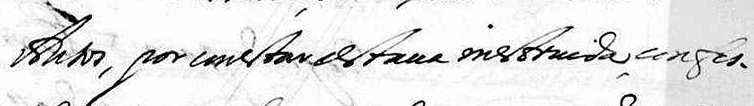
Autos, por constar estaua instruida, confes
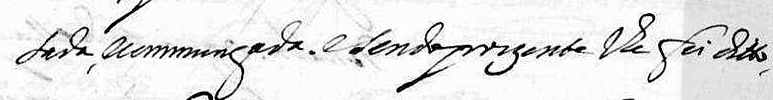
sada, e commungada. e sendo prezente lhe foi ditto
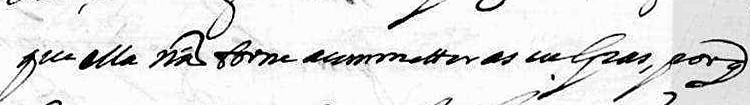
que ella naõ torne a commetter as culpas, porq̄
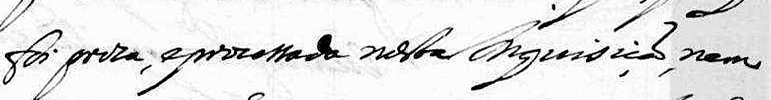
foi preza, e processada nesta Inquisiçaõ, nem
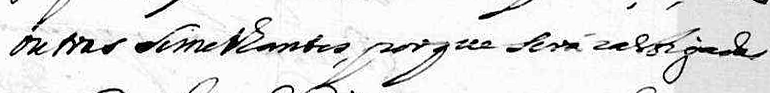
outras semelhantes, porque sera castigada
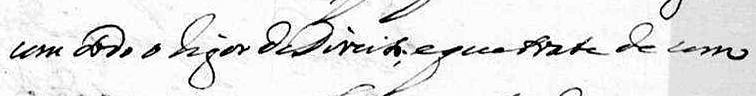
com todo o Rigor de Direito, e que trate de com
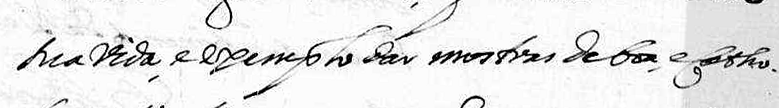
sua vida, e exemplo dar mostras de boa, e Catho
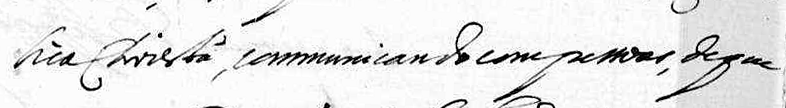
lica Christā, communicando com pessoas, de que
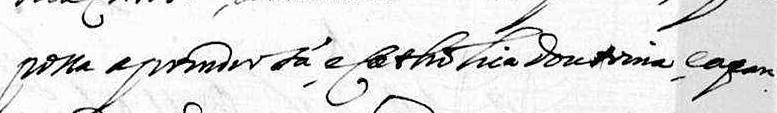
possa aprender sā, e Catholica doutrina e apar
